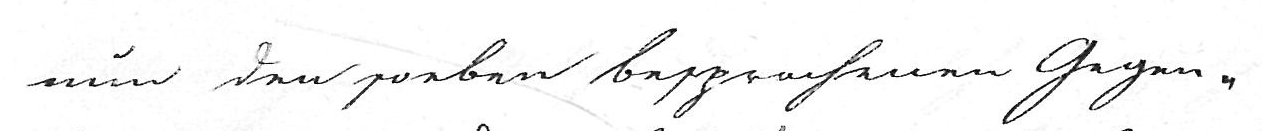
nun den soeben besprochenen Gegen-
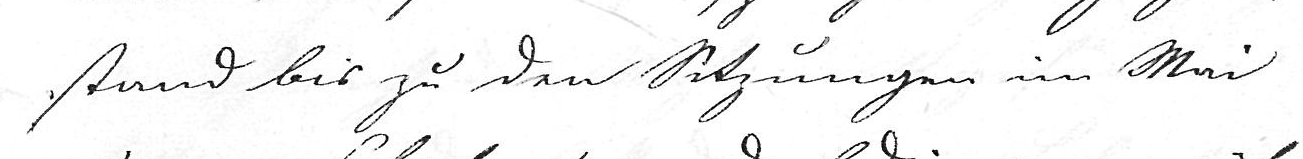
stand bis zu den Sitzungen im Mai
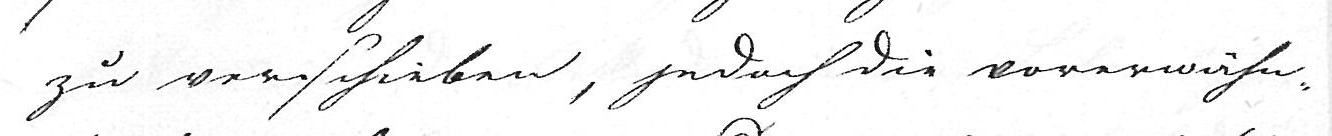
zu verschieben, jedoch die vorerwähn-
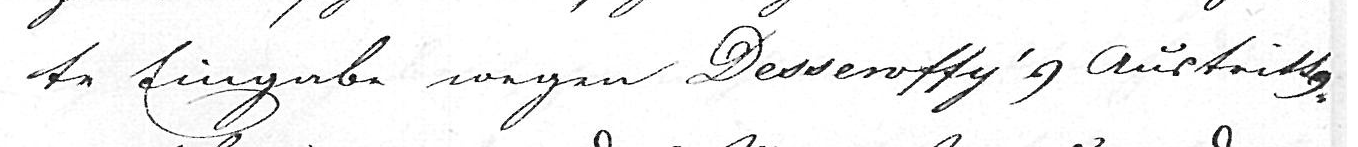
te Eingabe wegen Dessewffy's Austritts-
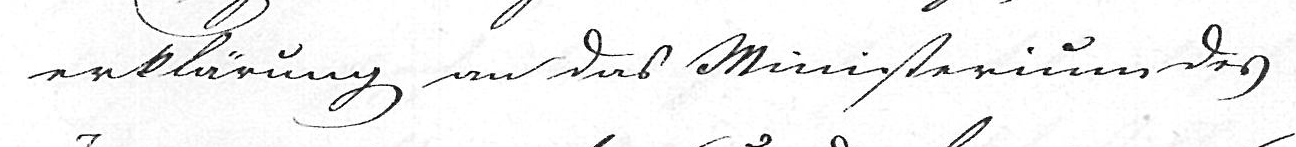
erklärung an das Ministerium des
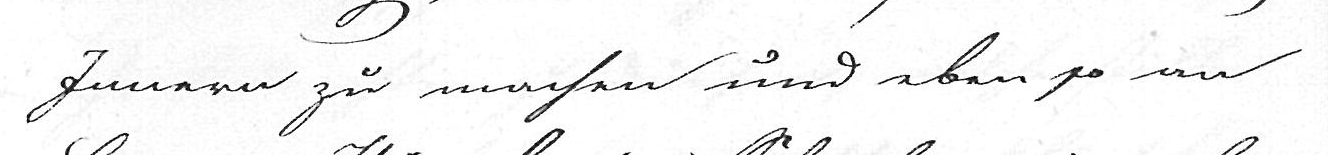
Innern zu machen und eben so an
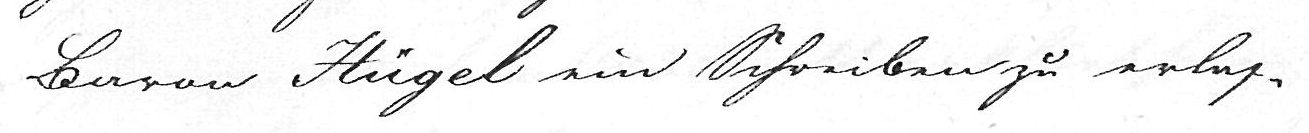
Baron Hügel ein Schreiben zu erlas-
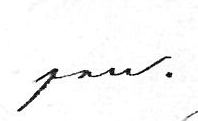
sen.
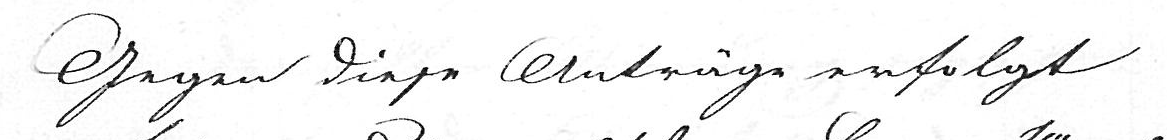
Gegen diese Anträge erfolgte
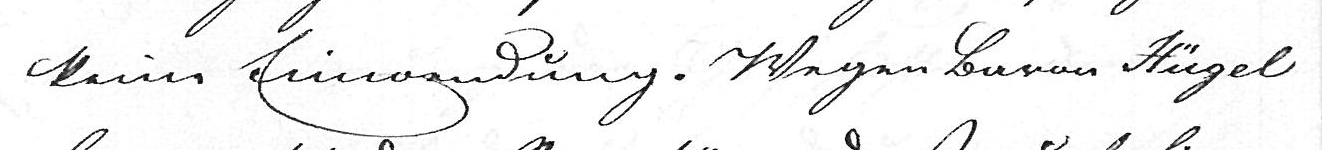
keine Einwendung. Wegen Baron Hügel
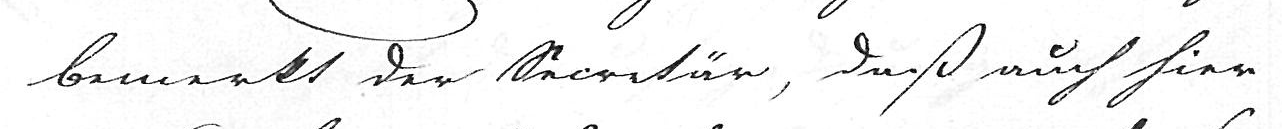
bemerkt der Secretär, daß auch hier
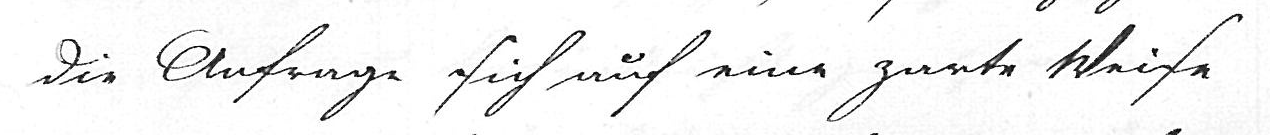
die Anfrage sich auf eine zarte Weise
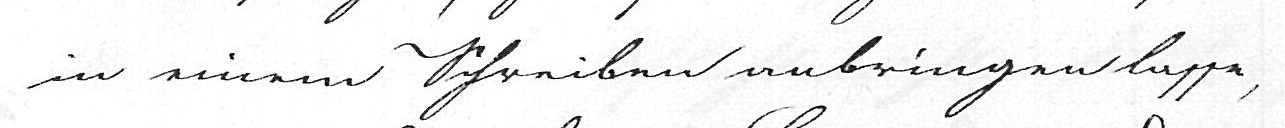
in einem Schreiben anbringen lasse,
